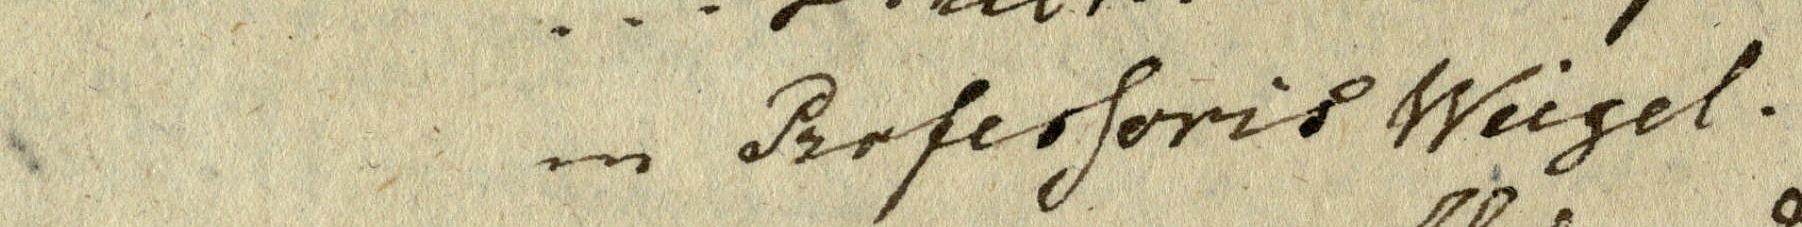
Professoris .
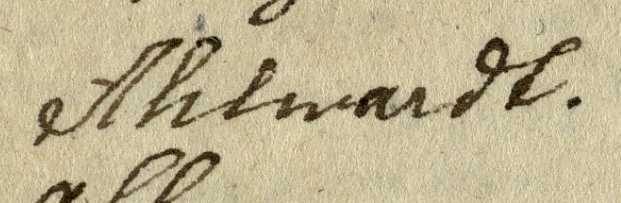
Ahlwardt.
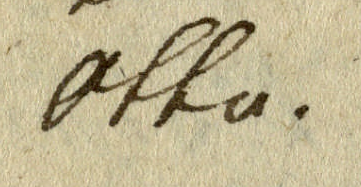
Otto.
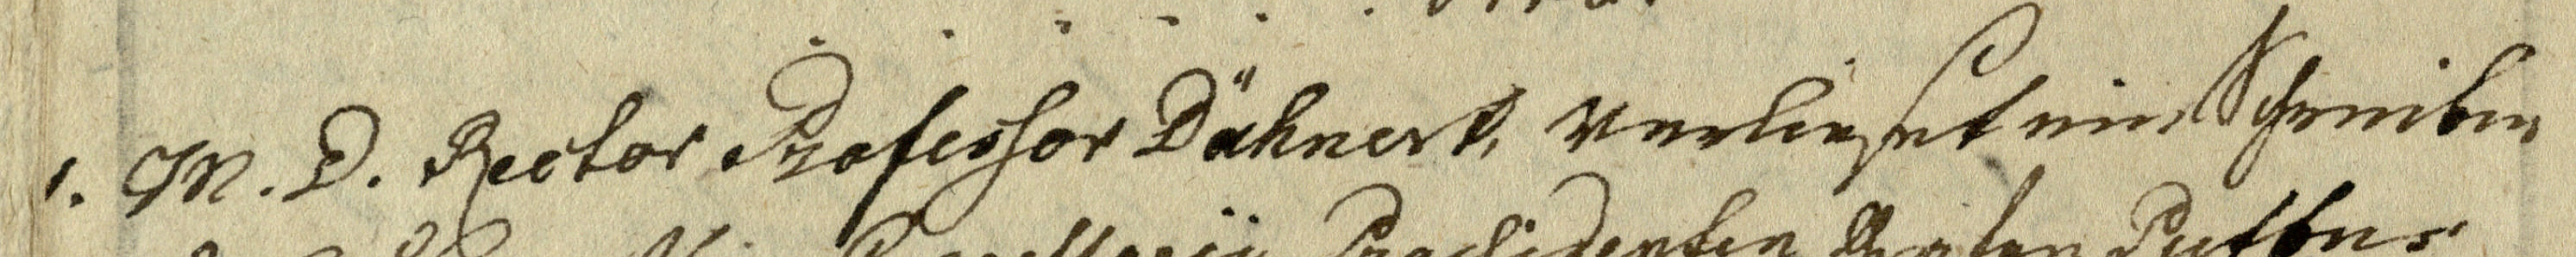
1. M. D. Rector Professor Dähnert verlieset ein Schreiben
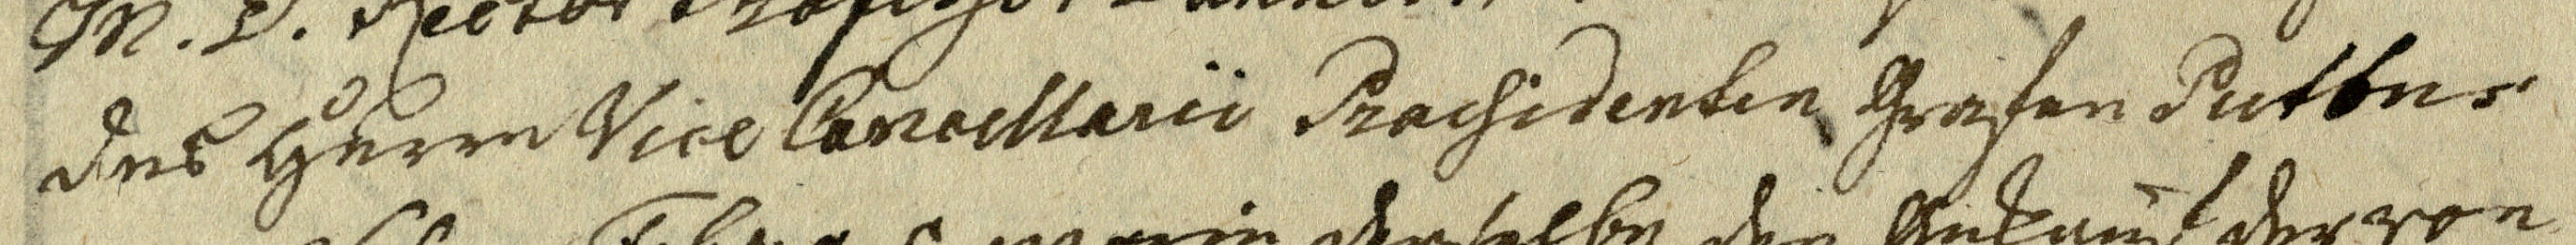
des Herrn ViceCancellarii Praesidenten Grafen Putbus
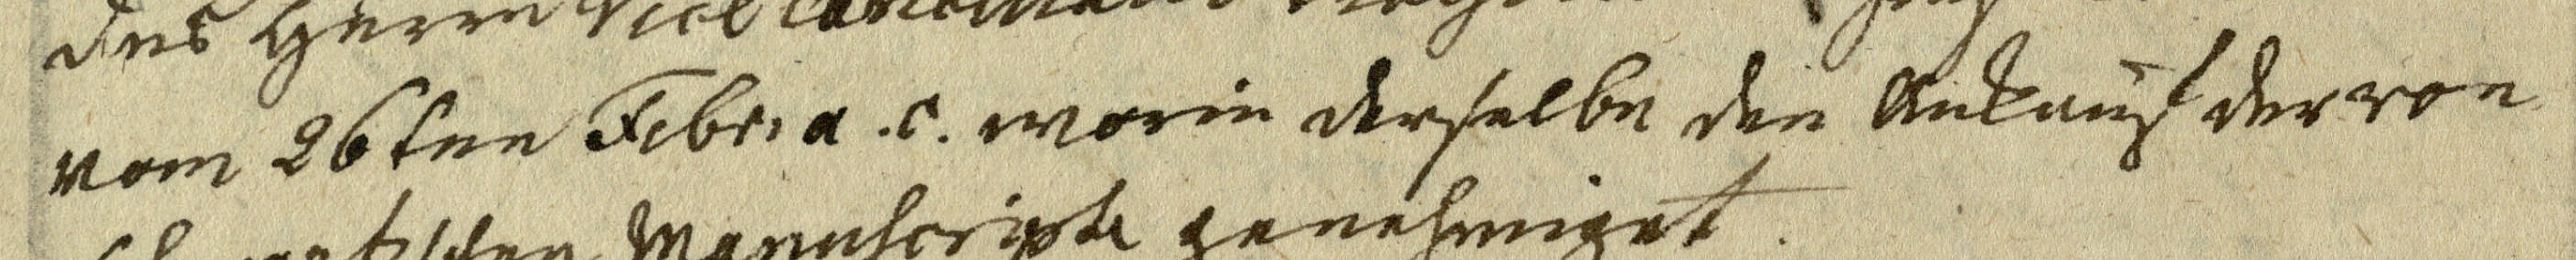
vom 26. Febr. a.c. worin derselbe den Ankauf der von
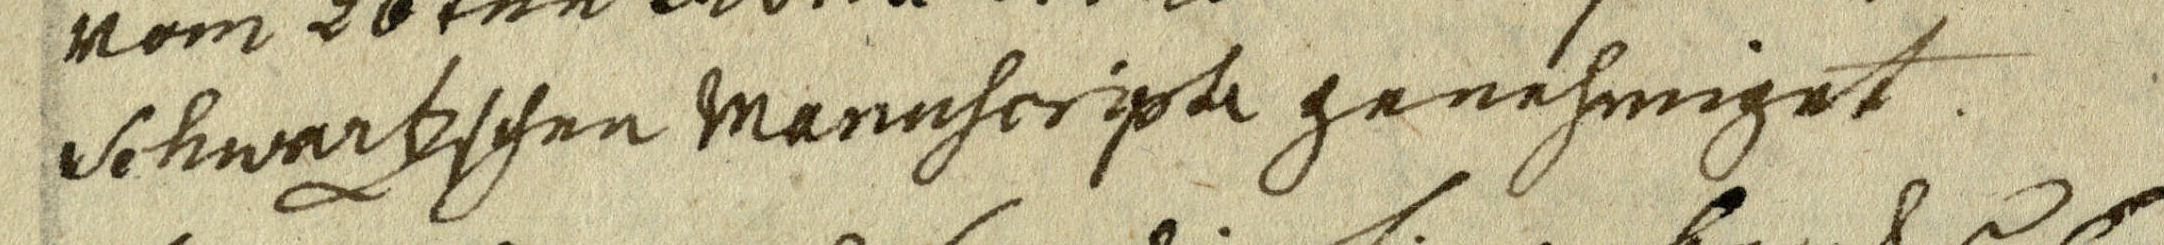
Schwartzschen Manuscripte genehmiget.
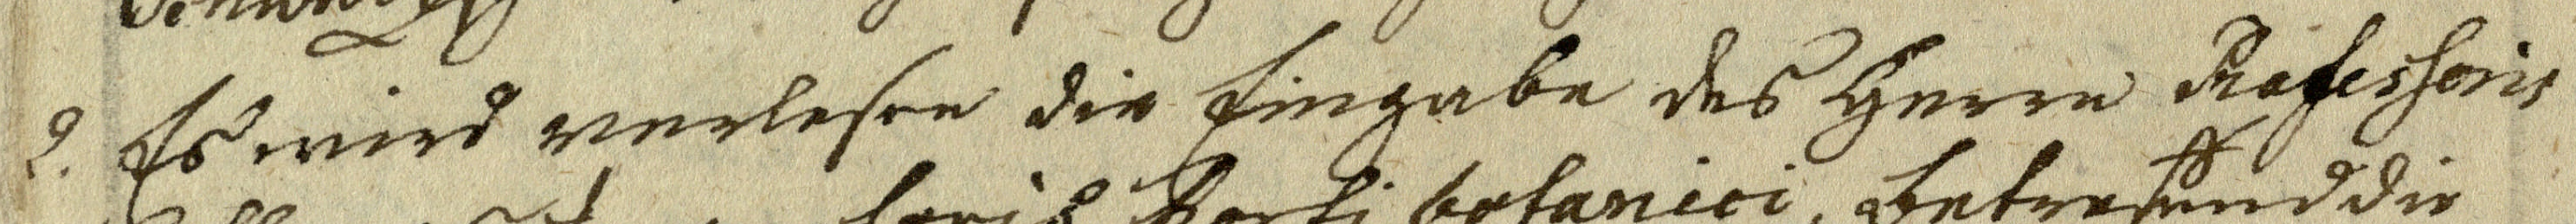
2. es wird verlesen die Eingabe des Herrn Professoris
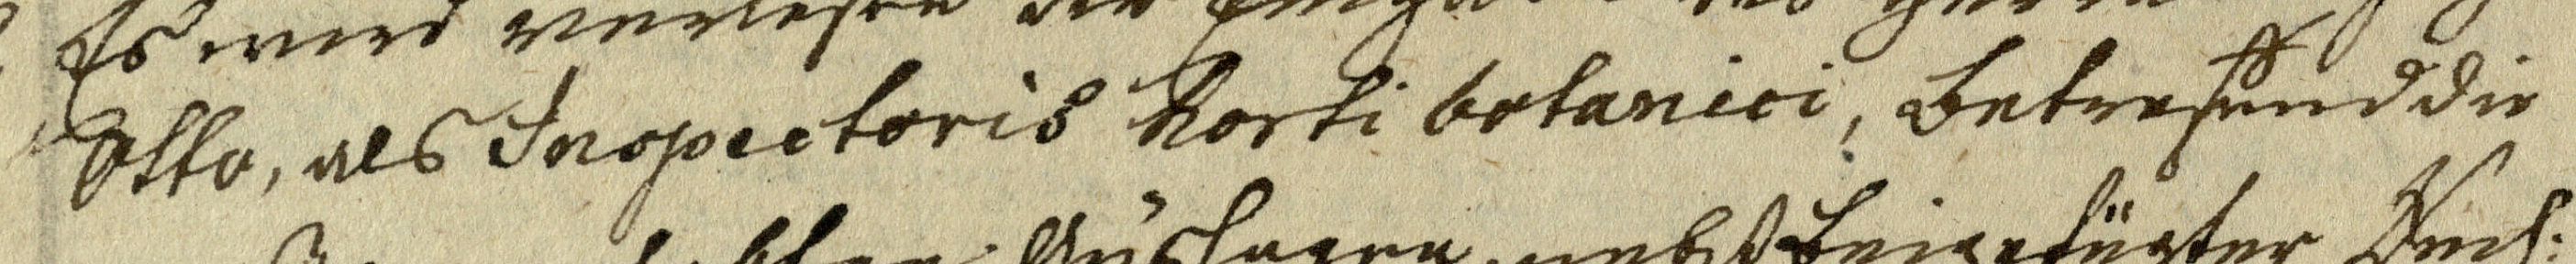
Otto, als Inspectoris Horti botanici, betreffend die
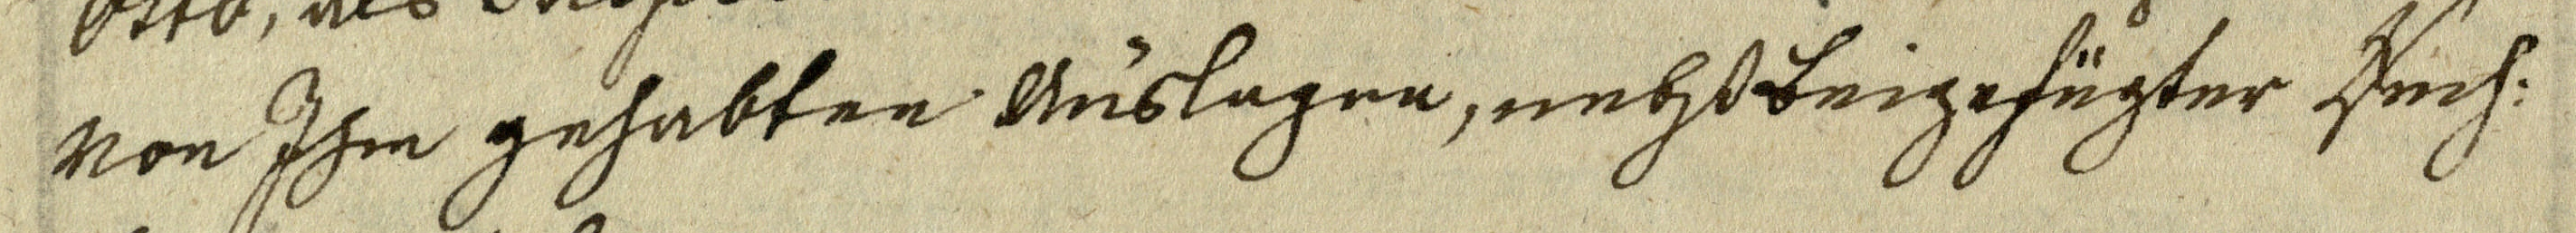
von Ihm gehabten Auslagen, nebst beigefügter Rech¬
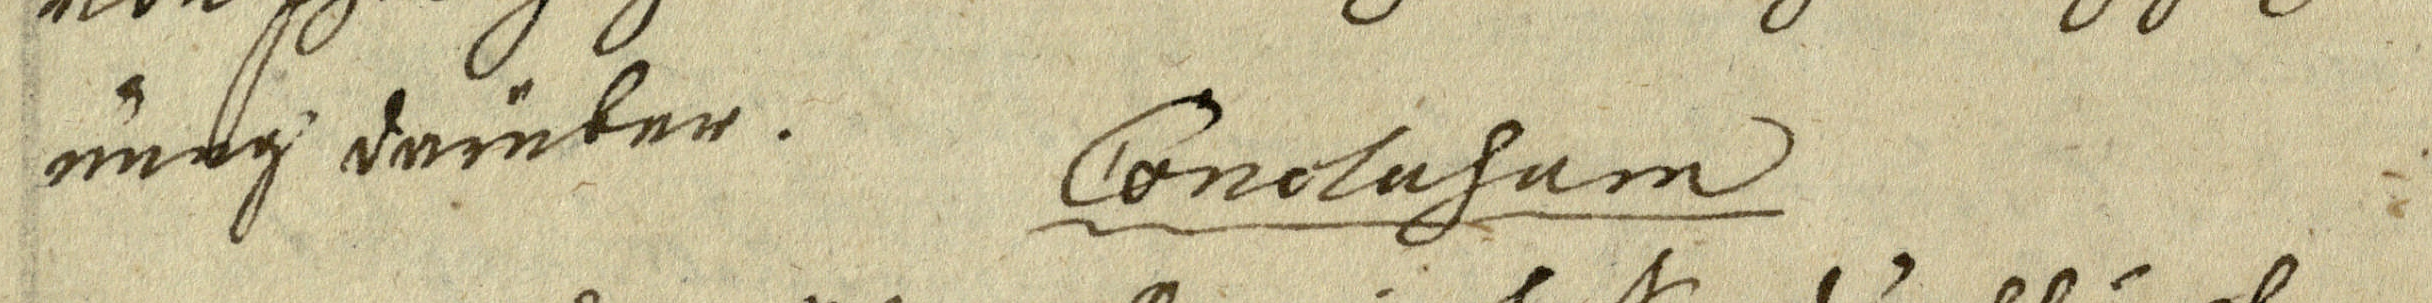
nung darüber. Conclusum
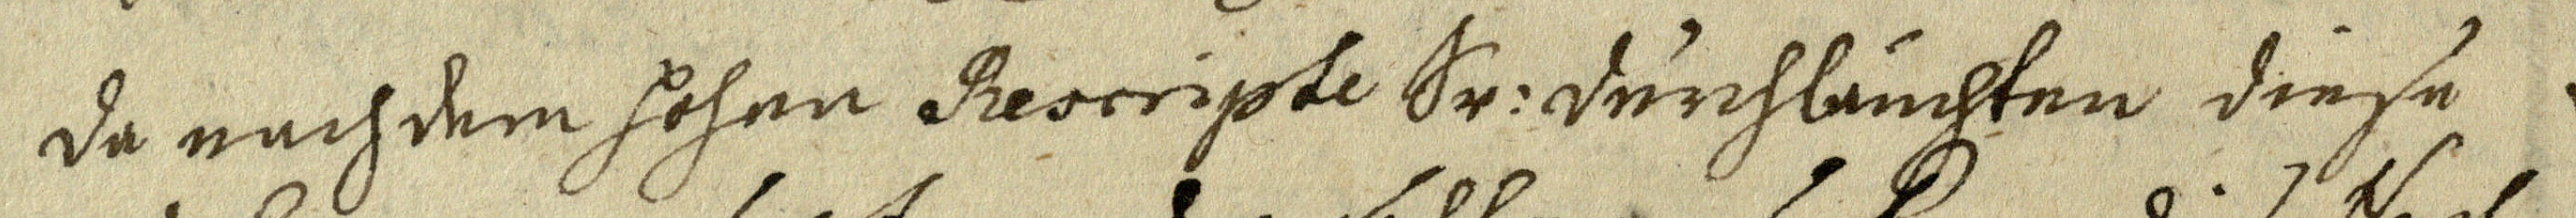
da nach dem hohen Rescripte Sr Durchlauchten diese
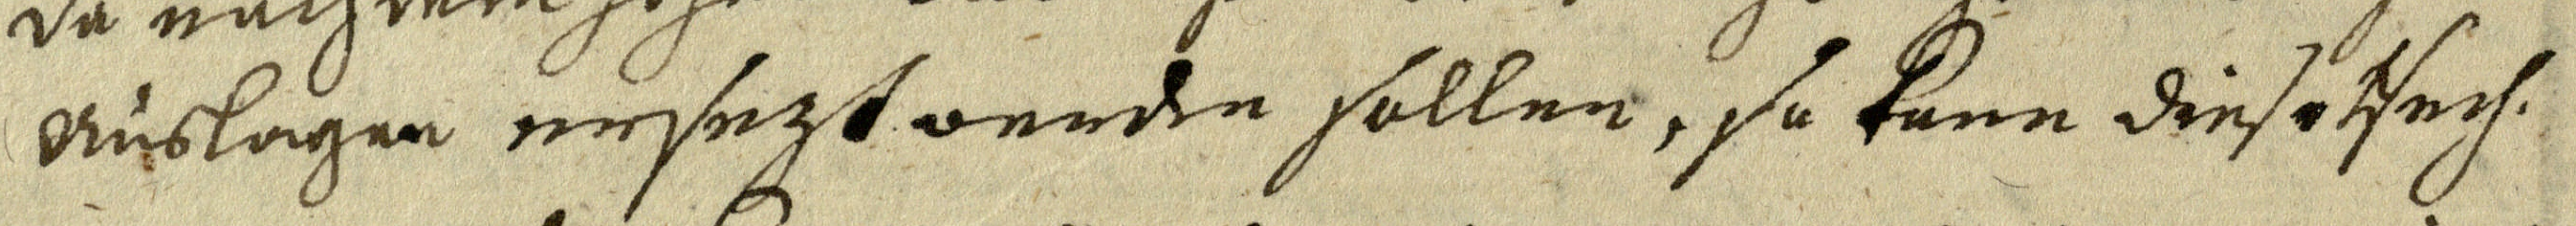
Auslagen ersetzt werden sollen, so kann diese Rech¬
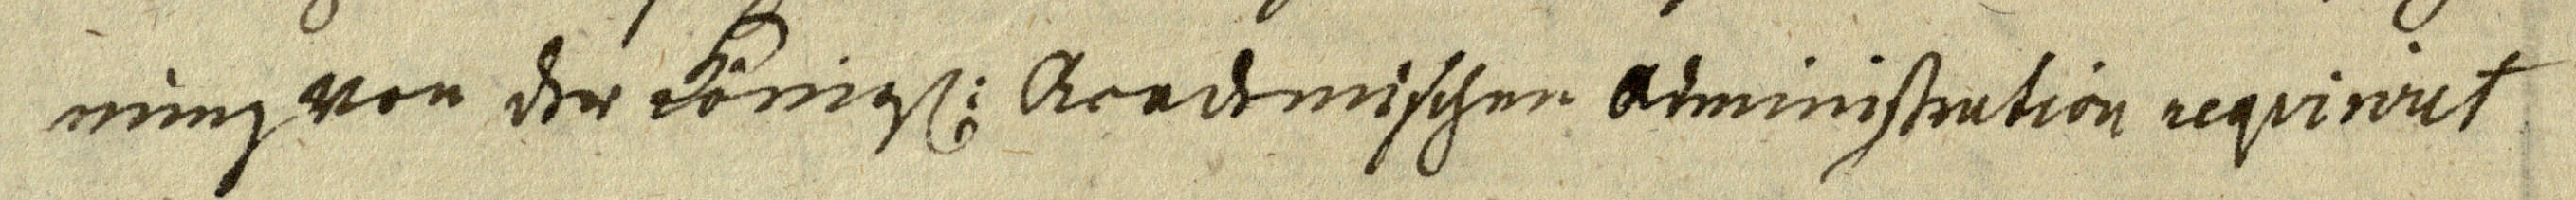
nung von der Königl. Academischen Administration requiriret
